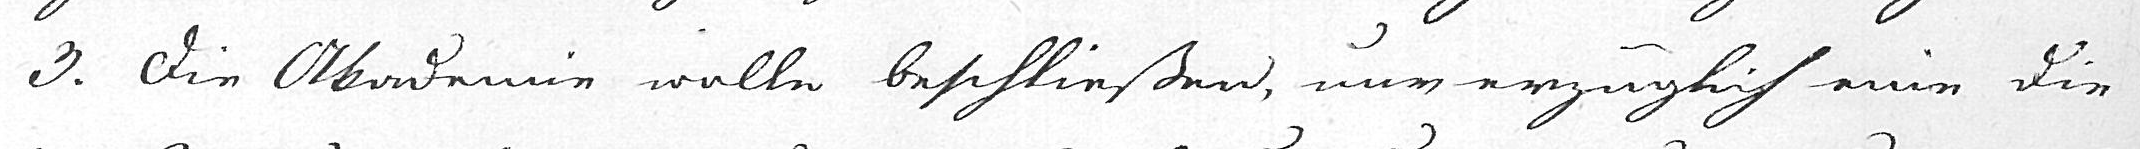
3. Die Akademie wolle beschließen, unverzüglich eine die
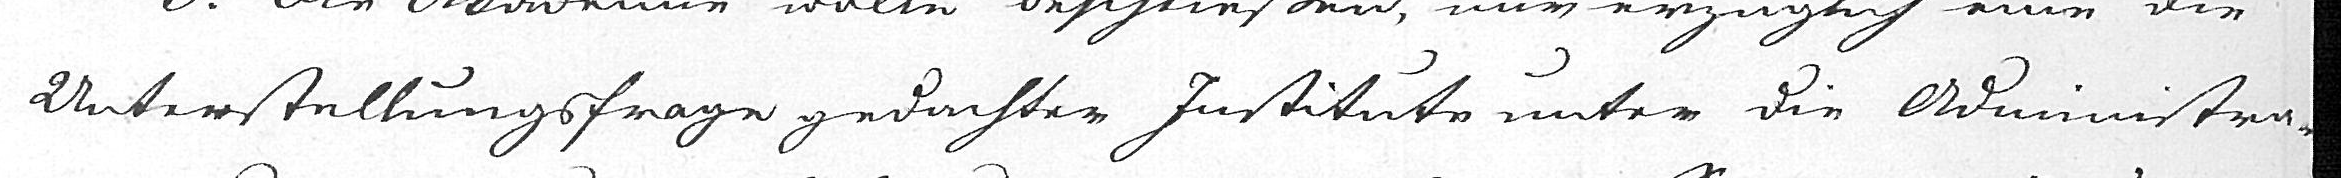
Unterstellungsfrage gedachter Institute unter die Administra-
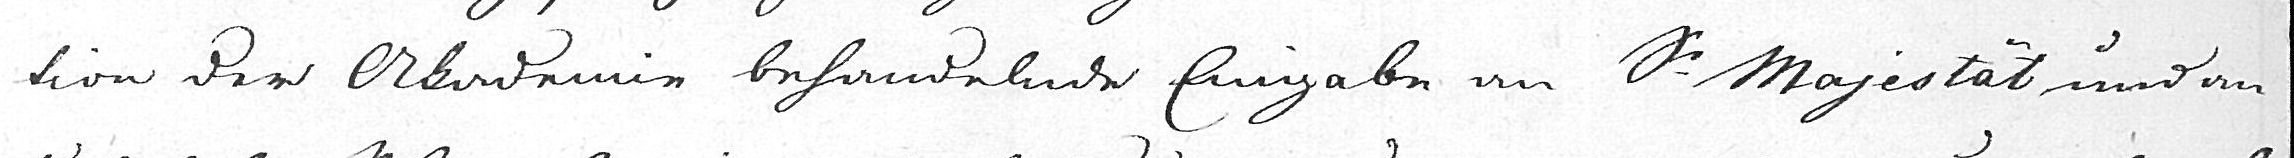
tion der Akademie behandelnde Eingabe an Sr Majestät und an
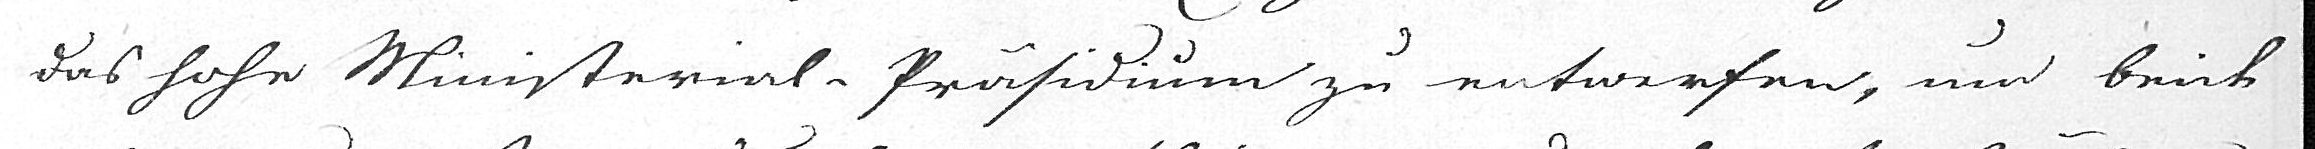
das hohe Ministerial-Präsidium zu entwerfen, um beide
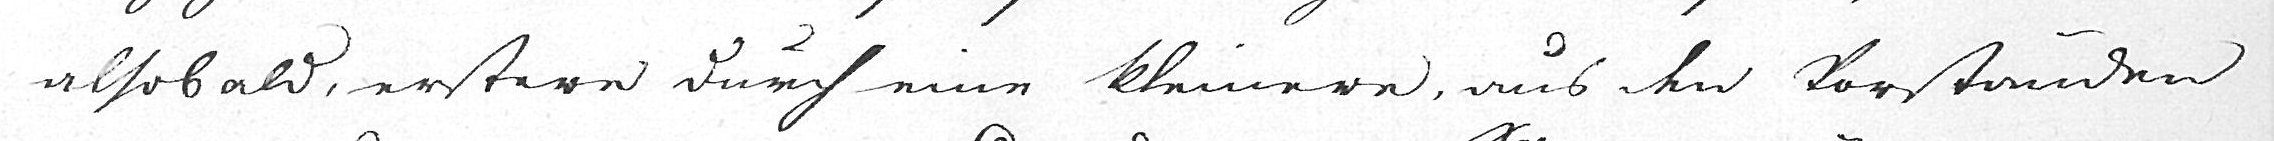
alsobald, erstere durch eine kleinere, aus den Vorständen
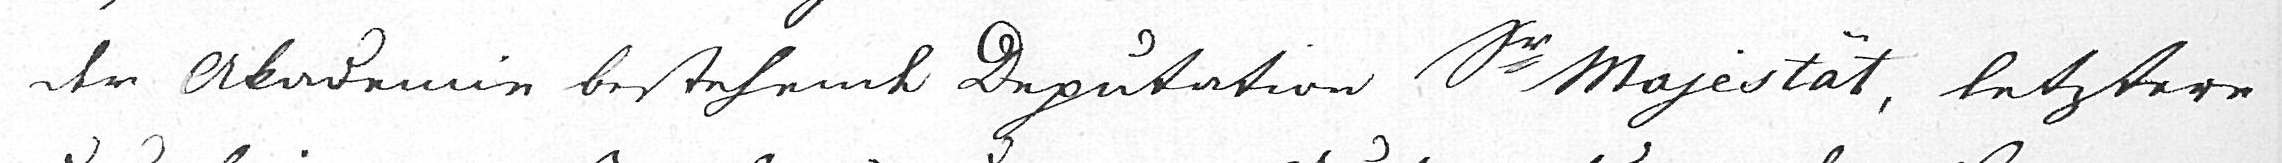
der Akademie bestehenden Deputation Sr Majestät, letztere
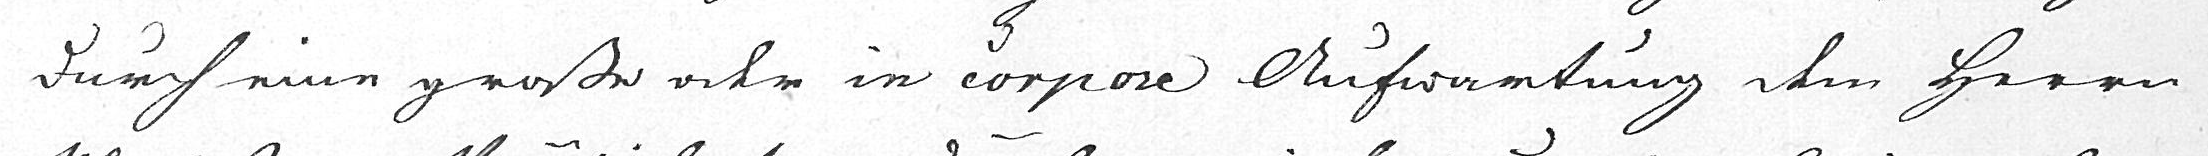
durch eine große oder in corpore Aufwartung dem Herrn
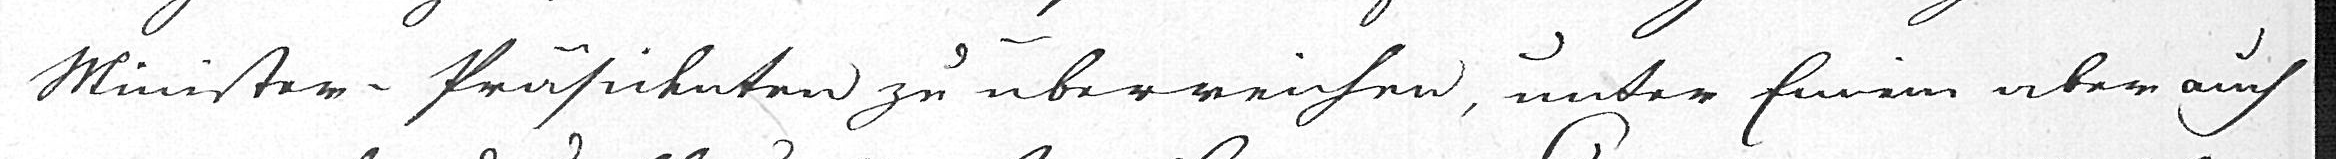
Minister-Präsidenten zu überreichen, unter Einem aber auch
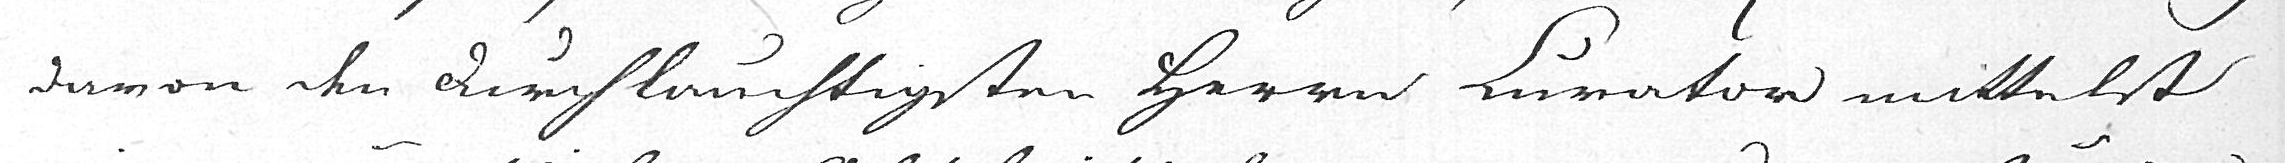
davon den durchlauchtigsten Herrn Curator mittels
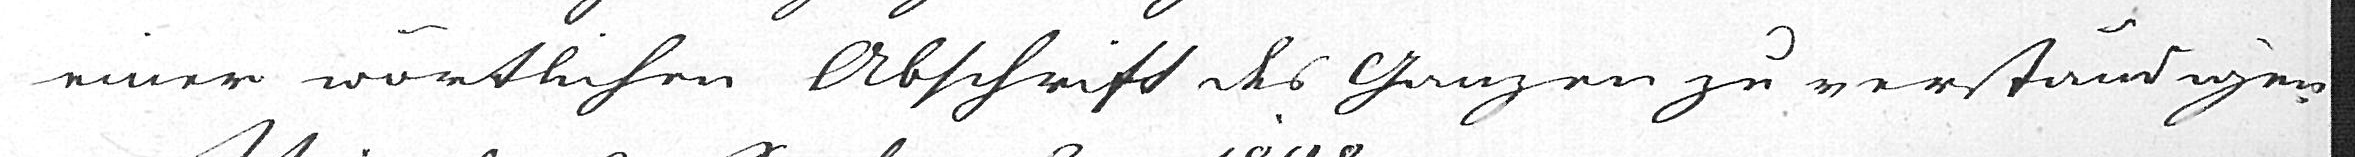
einer wörtlichen Abschrift des Ganzen zu verständigen.
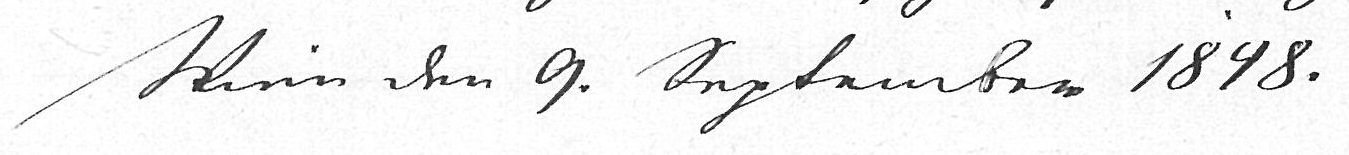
Wien den 9. September 1848.
